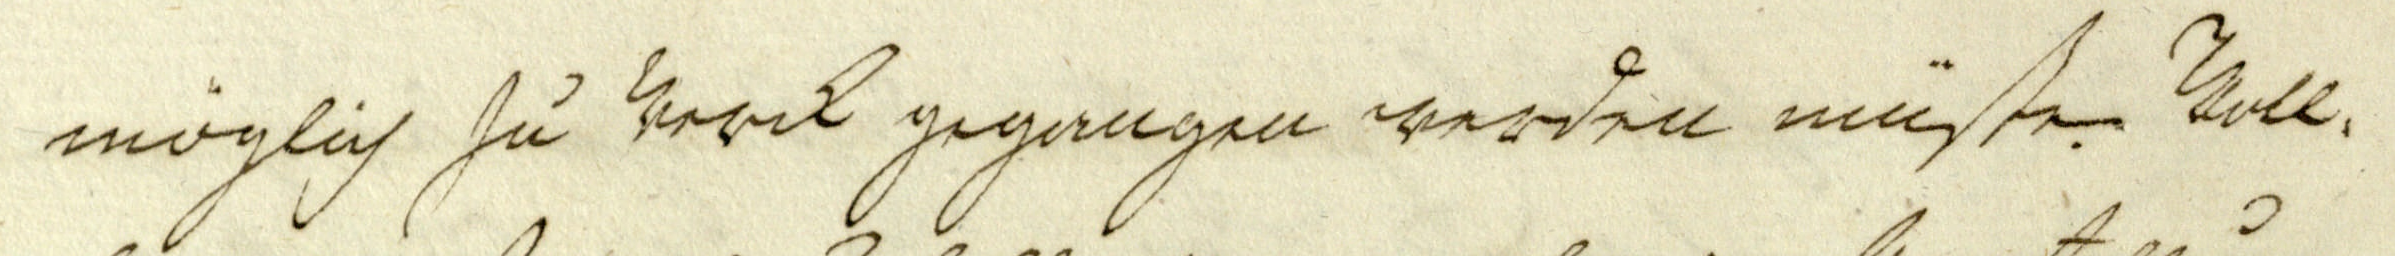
möglich zu Werck gegangen werden müste. Woll¬
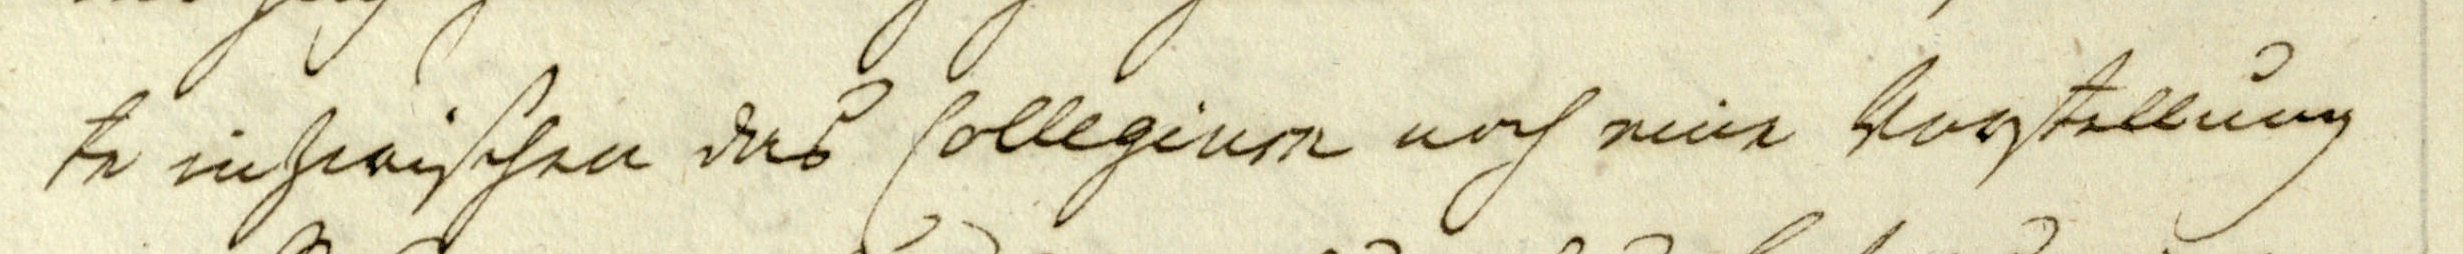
te inzwischen das Collegium noch eine Vorstellung
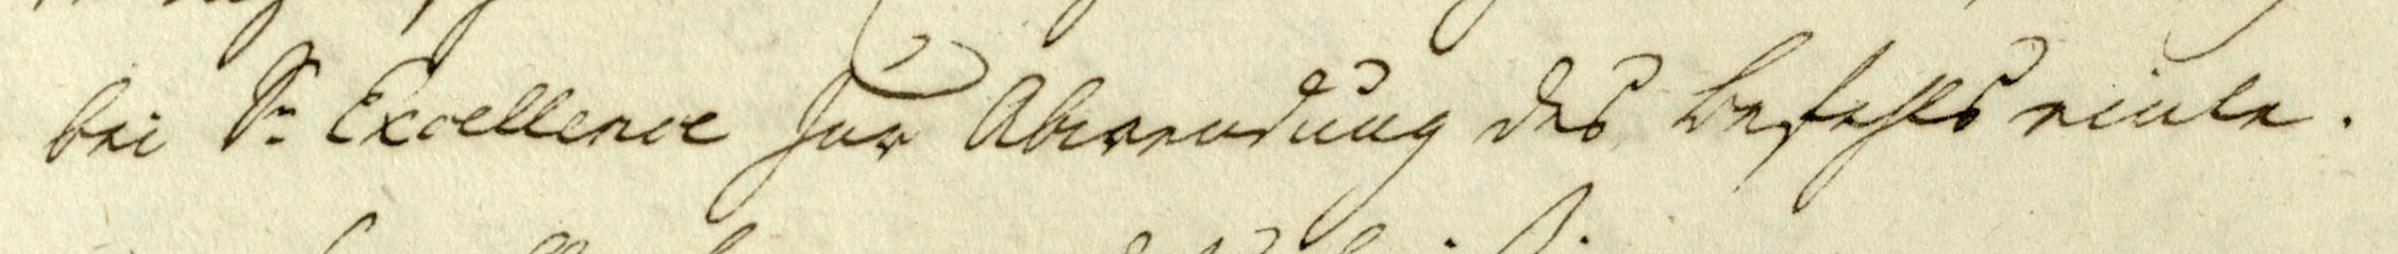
bei Sr. Excellnce zur Abwendung des Befehls einle¬
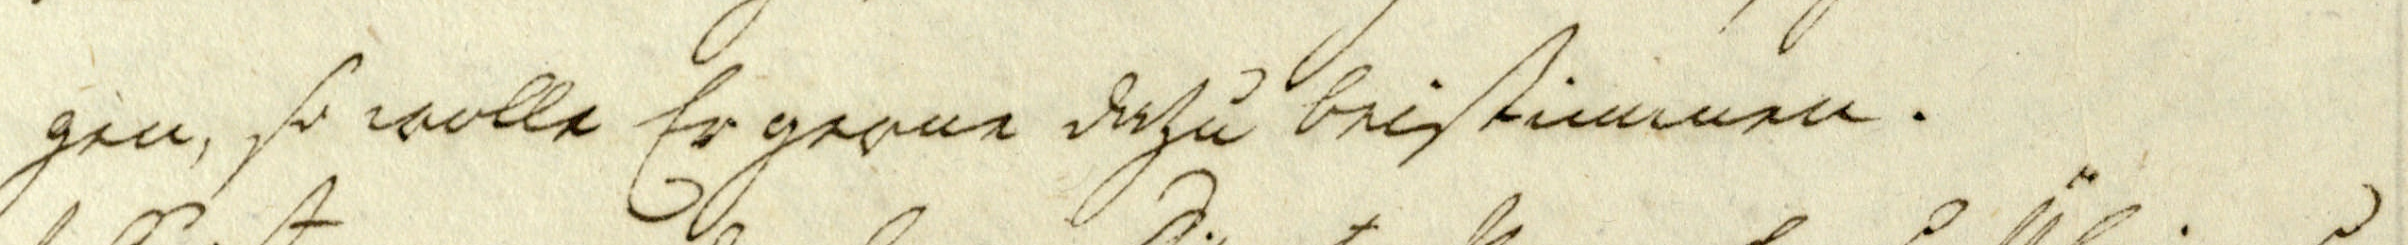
gen, so wolle Er gerne dazu beistimmen.
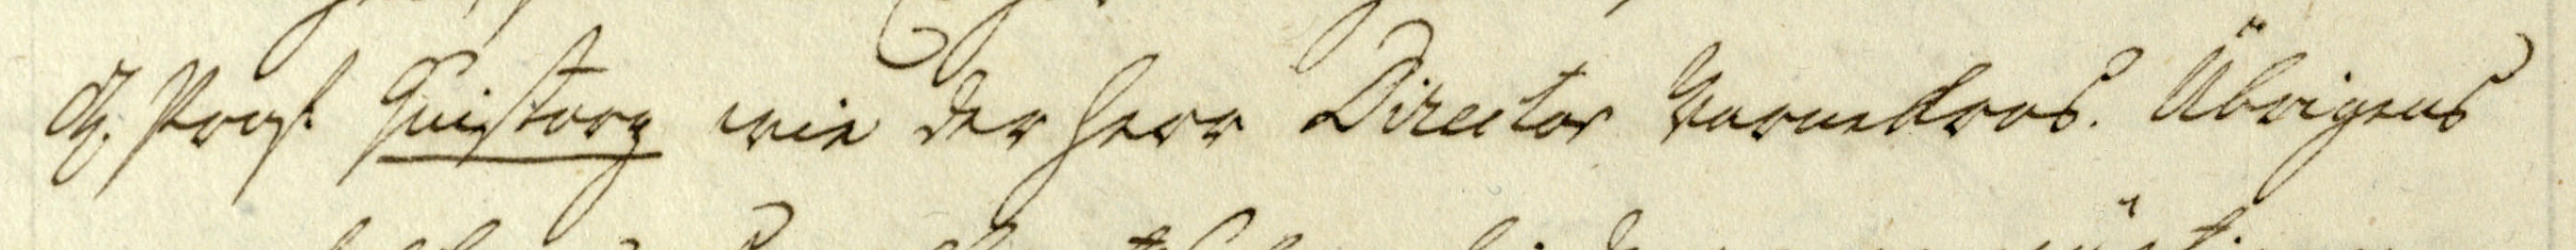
dh. Prof. Quistorp wie der herr Director Warnekros. Übrigens
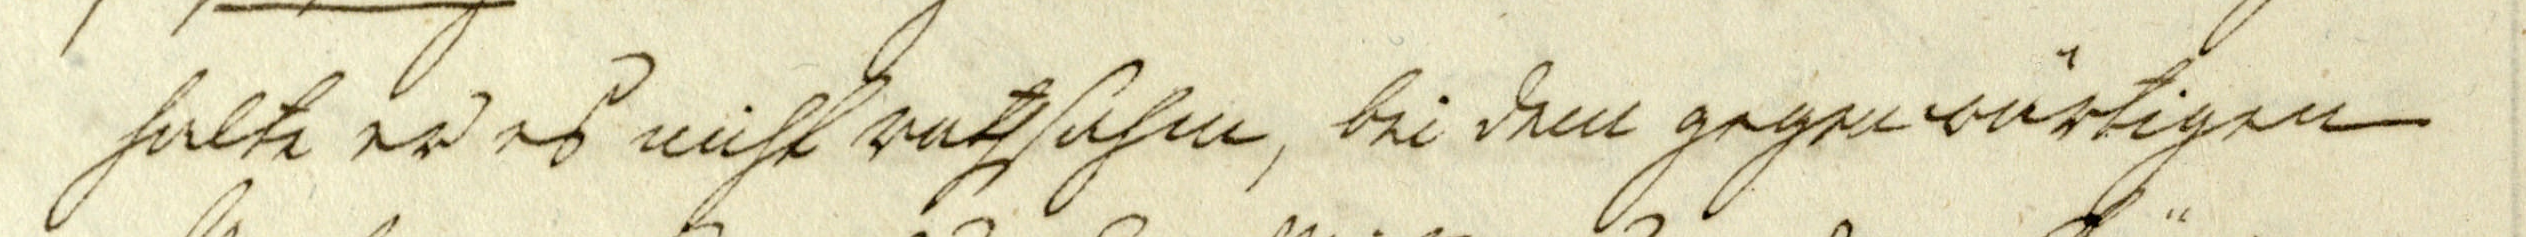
halte er es nicht rathsahm, bei dem gegenwärtigen
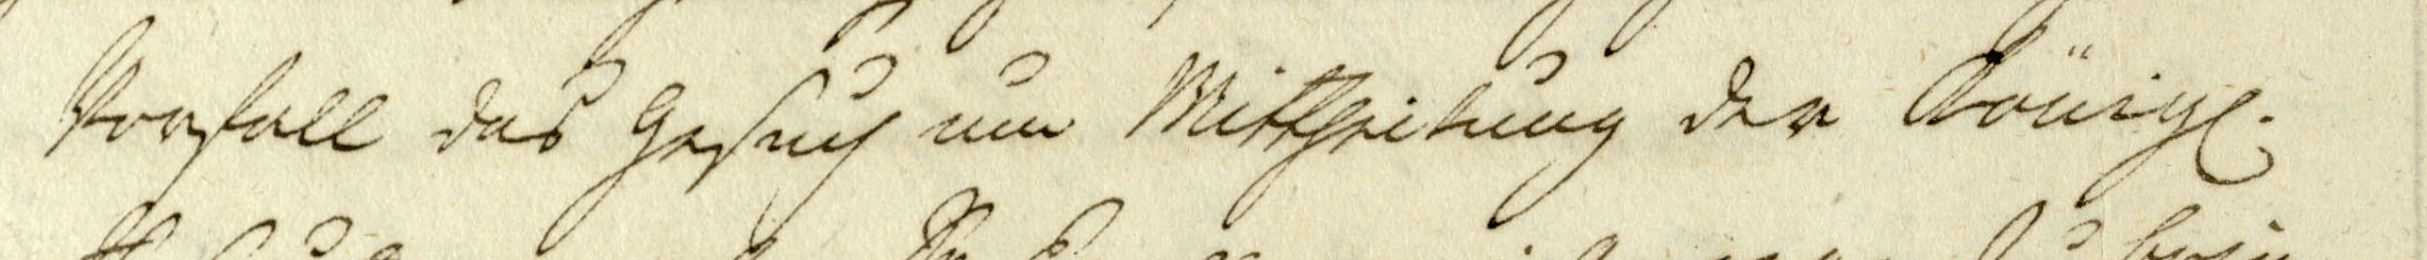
Vorfall das Gesuch um Mittheilung der Königl.
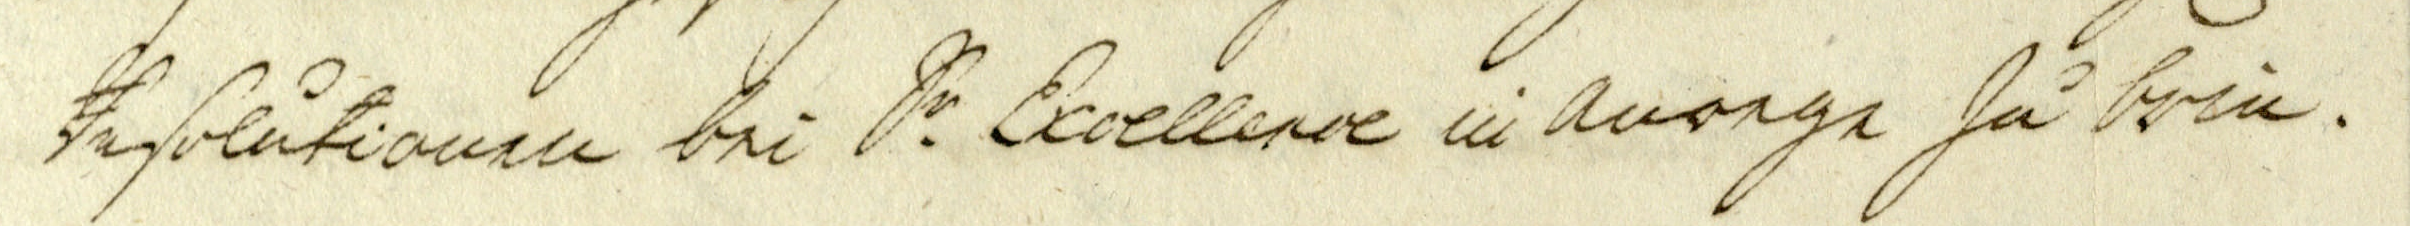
Resolutionen bei Sr. Excellence in Anzeige zu brin¬
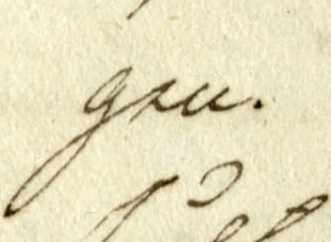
gen.
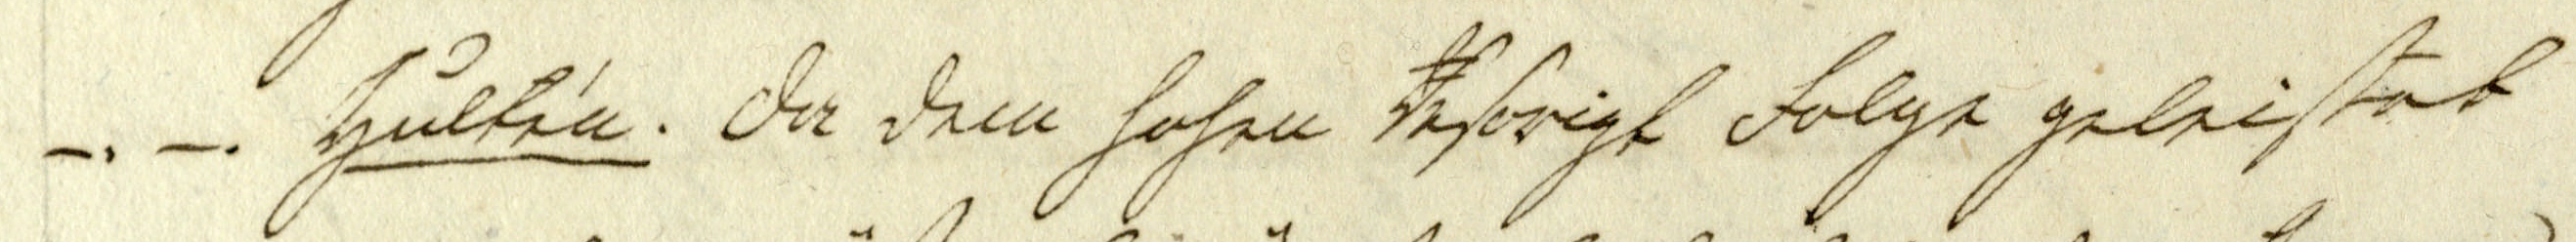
Hultèn. da dem hohen Rescript Folge geleistet
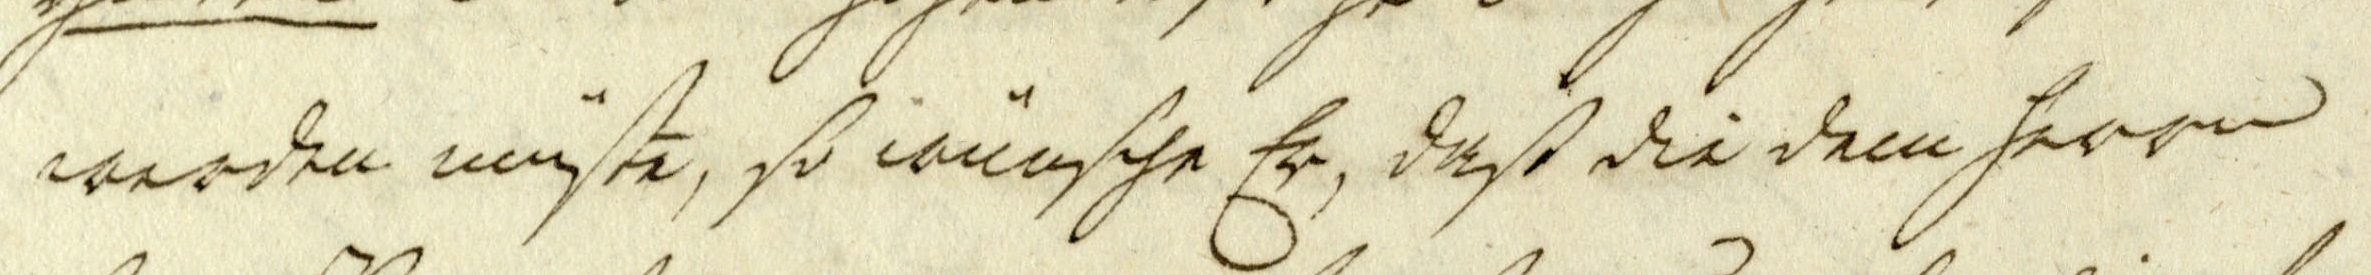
werden müste, so wünsche Er, daß die dem Herrn
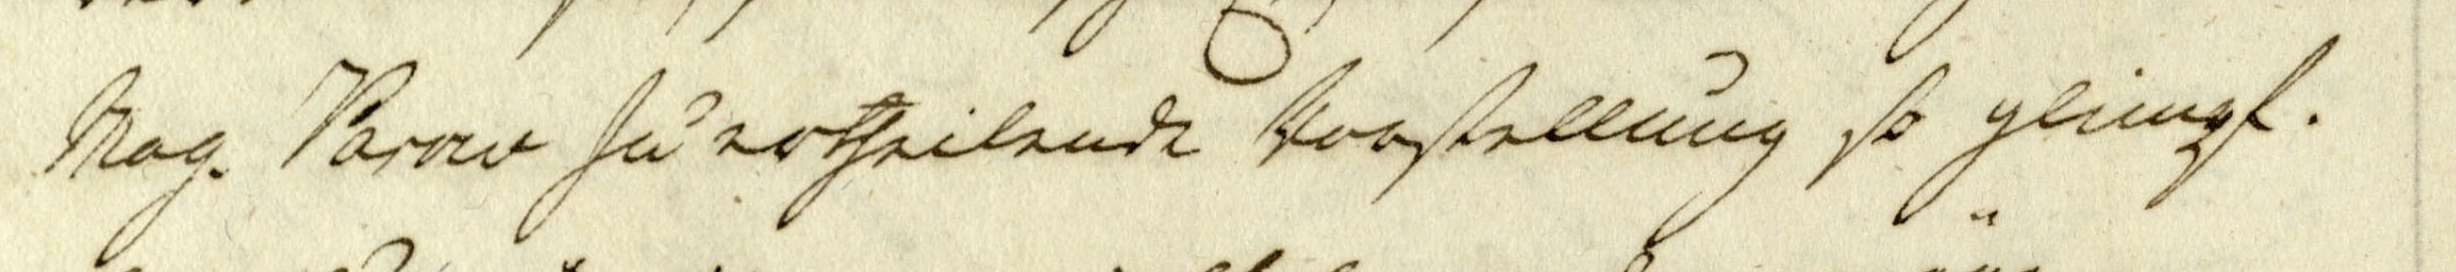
Mag. Parow zu ertheilende Vorstellung so glimpf¬
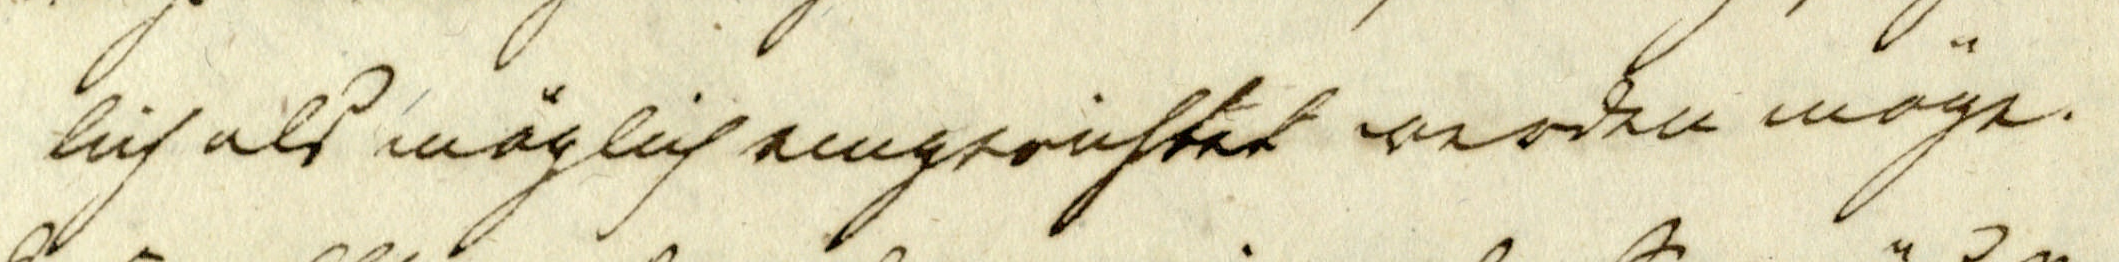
lich als möglich eingerichtet werden möge.
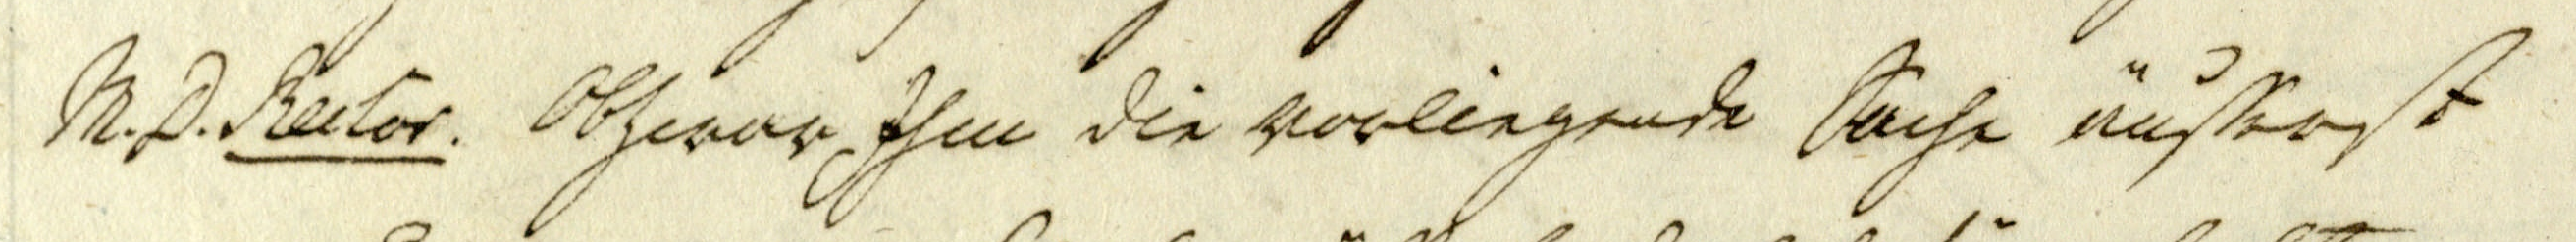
M. D. Rector. Obzwar Ihm die vorliegende Sache äusserst
